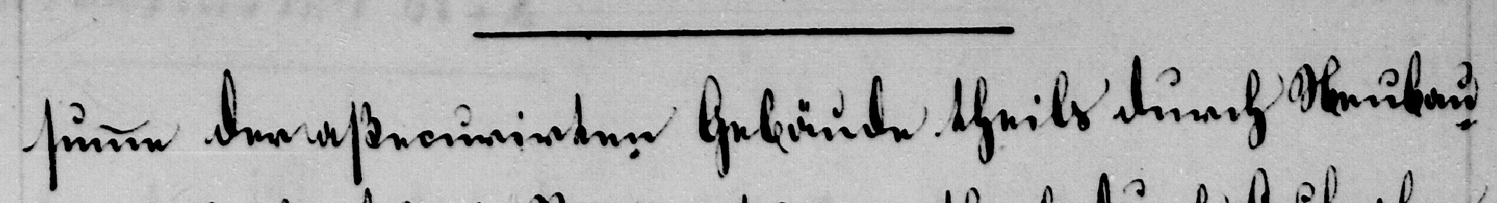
summe der aßecurirten Gebäude theils durch Neubau¬
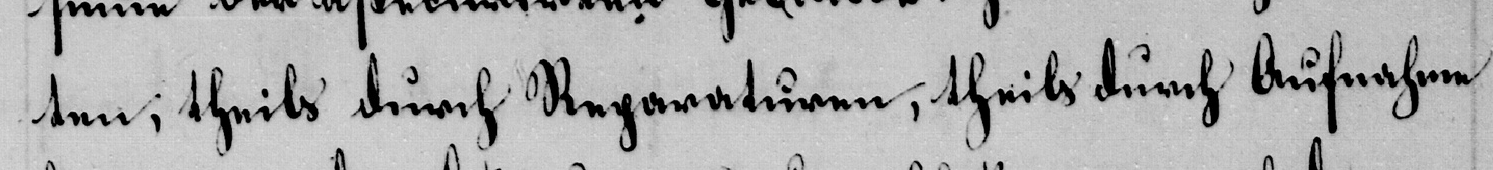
ten; theils durch Reparaturen, theils durch Aufnahme
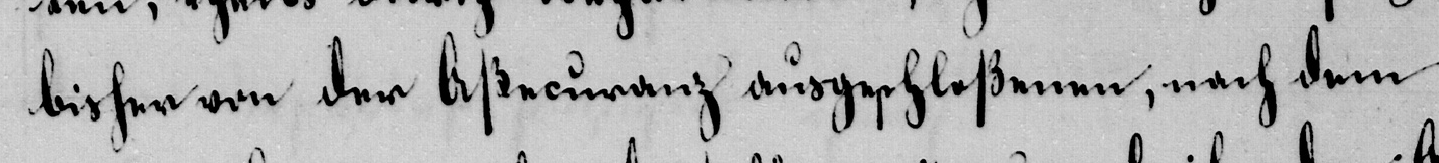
bisher von der Aßecuranz ausgeschloßenen, nach dem
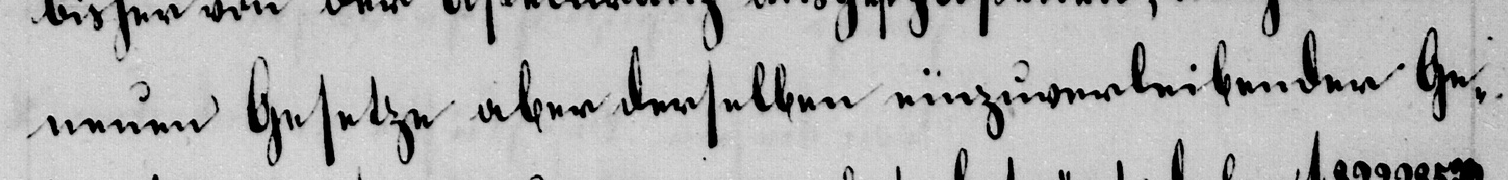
neuen Gesetze aber derselben einzuverleibenden Ge¬
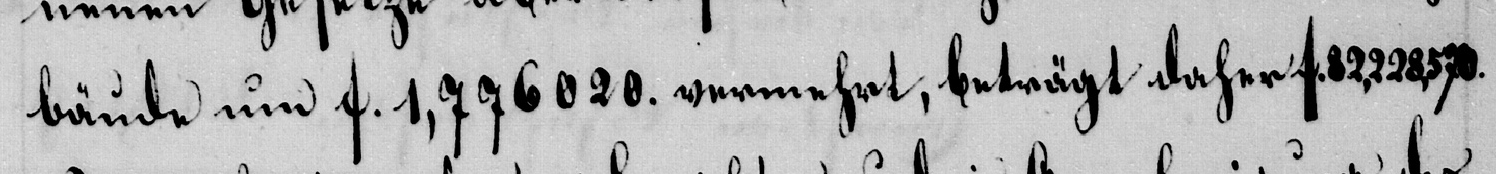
bäude um f. 1,776020. vermehrt, beträgt daher f. 82,228,570.
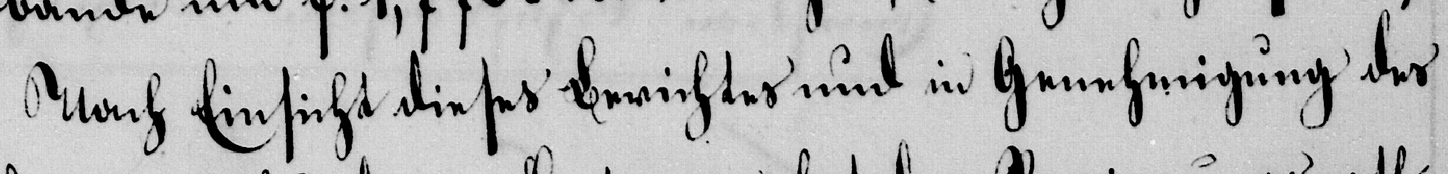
Nach Einsicht dieses Berichtes und in Genehmigung des
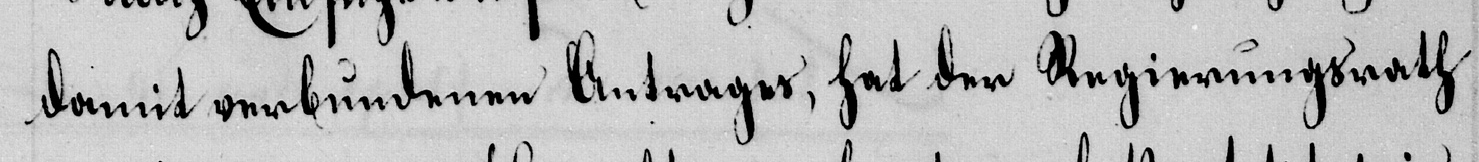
damit verbundenen Antrages, hat der Regierungsrath
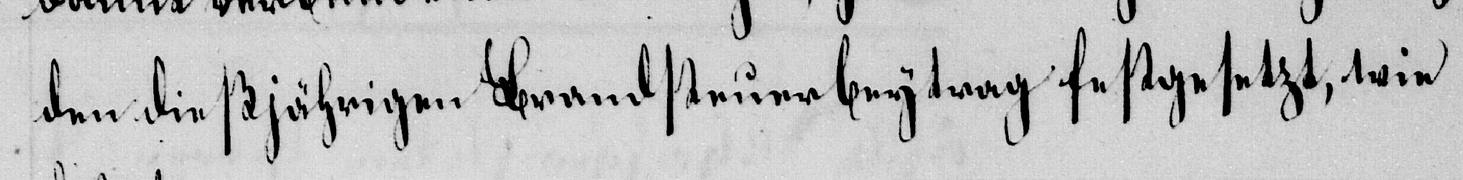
den dießjährigen Brandsteuerbeytrag festgesetzt, wie
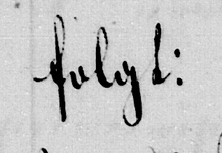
folgt:
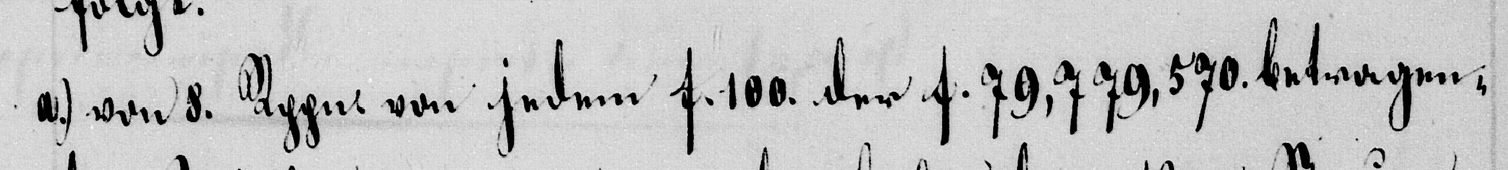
a.) von 8. Rppn. von jedem f. 100. der f. 79,779,570. betragen¬
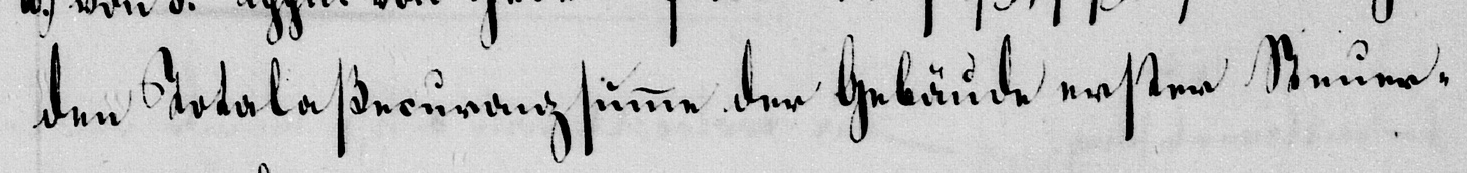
den Totalaßecuranzsumme der Gebäude erster Steuer¬
